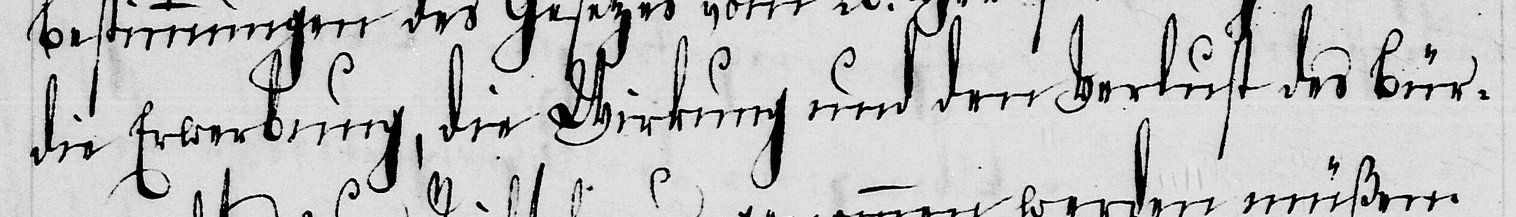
die Erwerbung, die Wirkung und den Verlauf des Bür¬
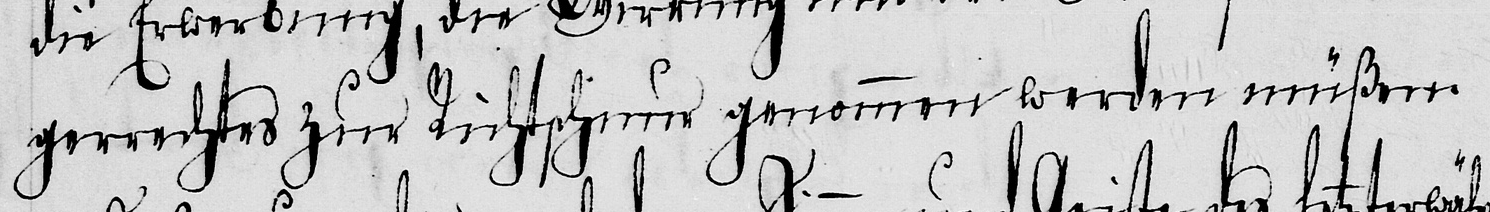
gerrechtes zur Richtschnur genommen werden müßen.
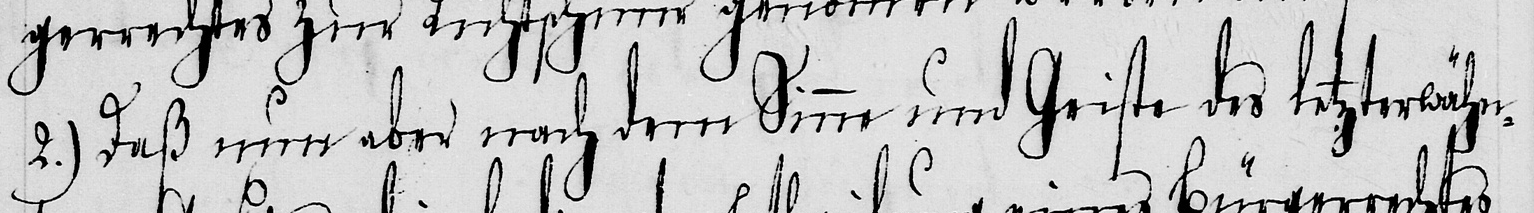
2.) Daß nun aber nach dem Sinne und Geiste des letzterwäh¬
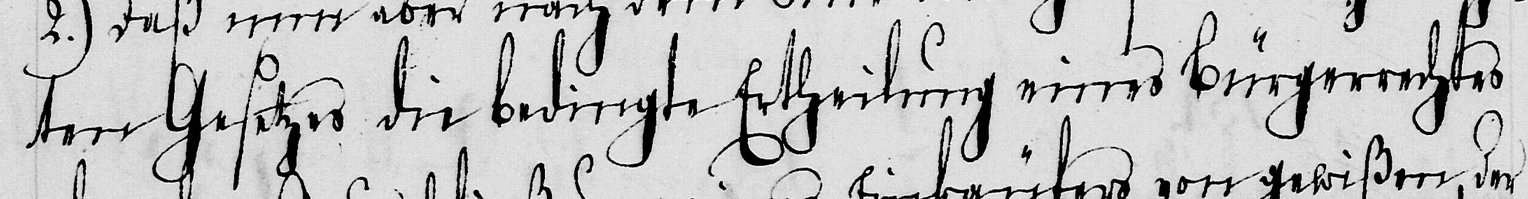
nten Gesetzes die bedingte Ertheilung eines Bürgerrechtes
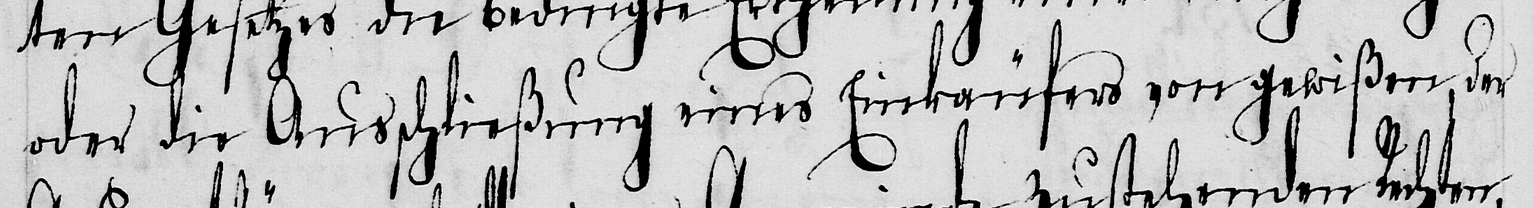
oder die Ausschließung eines Einkäufers von gewißen, der
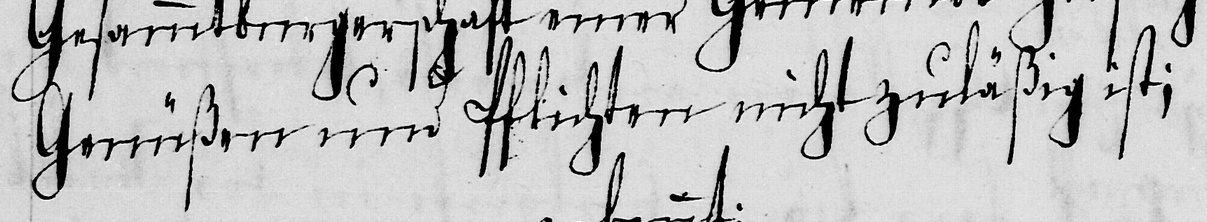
Genüßen und Pflichten nicht zuläßig ist;
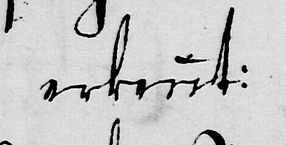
erkennt:
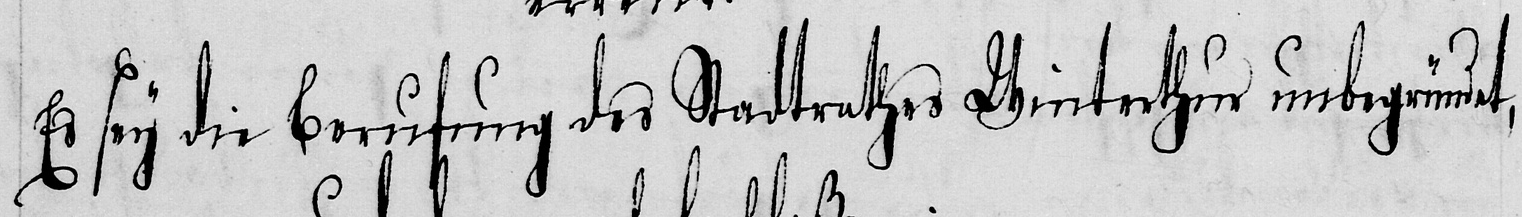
Es sey die Berufung des Stadtrathes Winterthur unbegrün¬
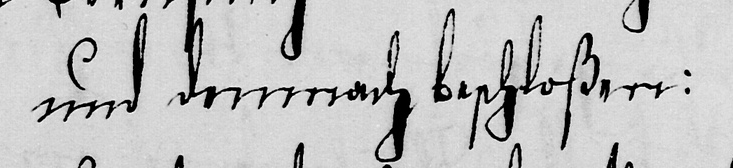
und demnach beschloßen:
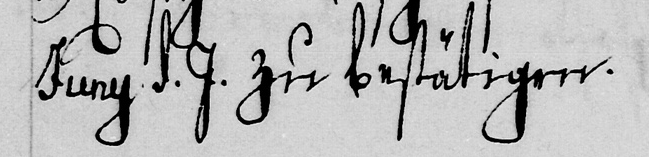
Juny d. J. zu bestätigen.
